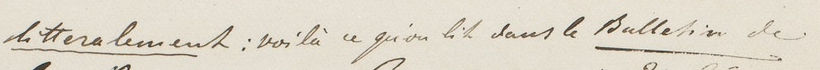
litteralement: voilà ce qu'on lit dans le Bulletin de
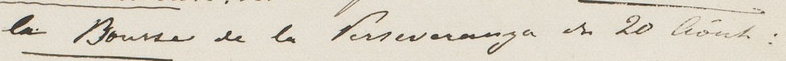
la Bourse de la Perserveranza du 20 Août:
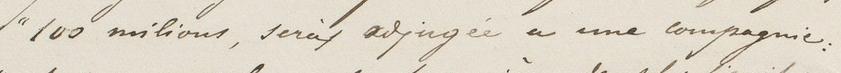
100 milions, serais adjugée a une compagnie:
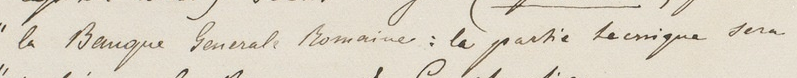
la Banque Generale Romaine: la partie tecnique sera
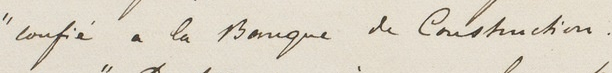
confié a la Banque de Construction.
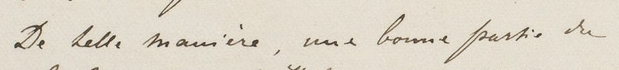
De telle manière, une bonne partie du
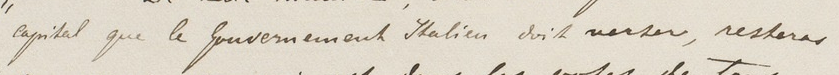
capital que le Gouvernement Italien doit verser, resteras
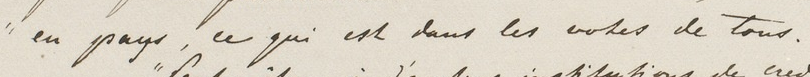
en pays, ce qui est dans les votes de tous.
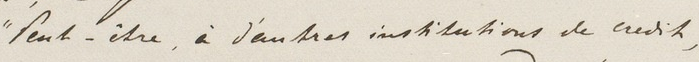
Peut-être, à d'autres institutions de credit,
